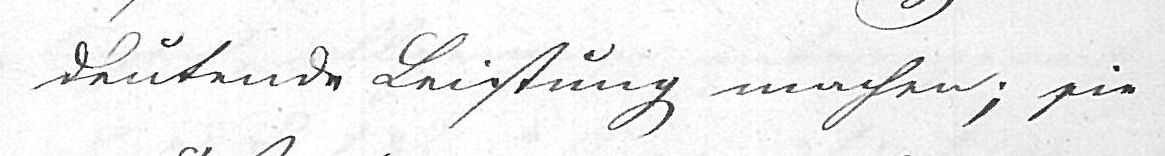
deutende Leistung machen; sie
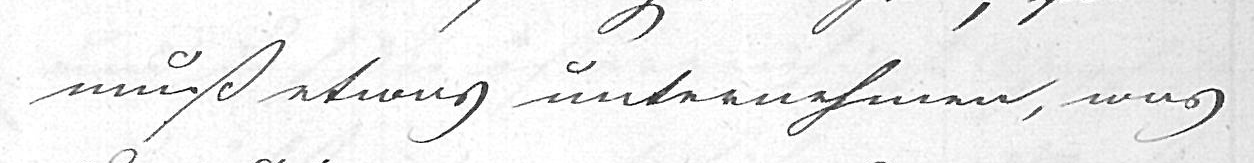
muß etwas unternehmen, was
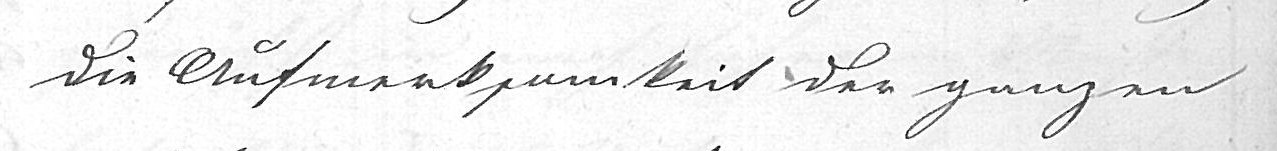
die Aufmerksamkeit der ganzen
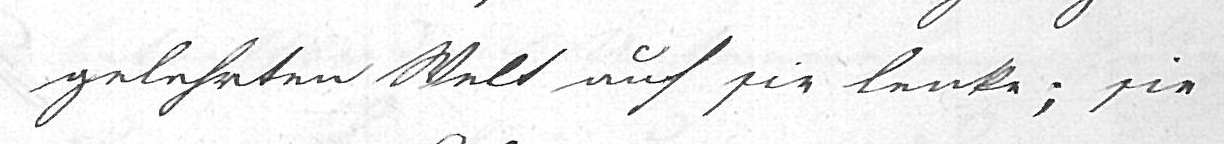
gelehrten Welt auf sie lenke; sie
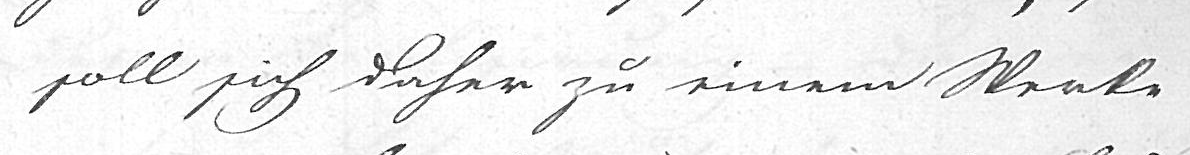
soll sich daher zu einem Werke
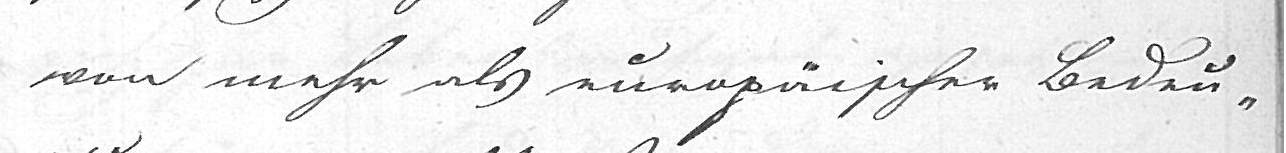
von mehr als europäischer Bedeu-
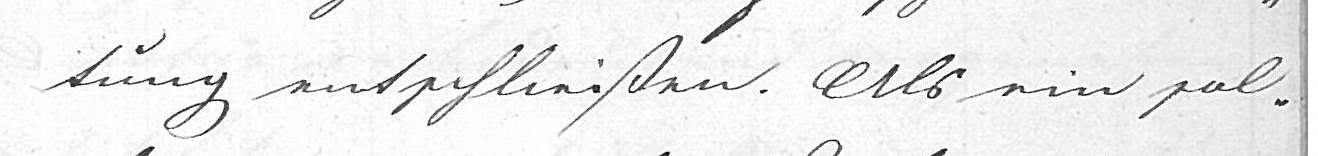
lung entschließen. Als ein sol-
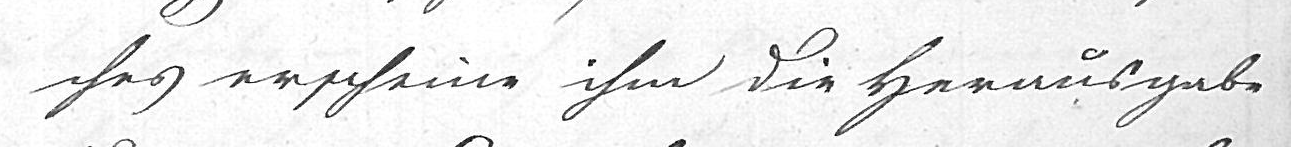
ches erscheine ihm die Herausgabe
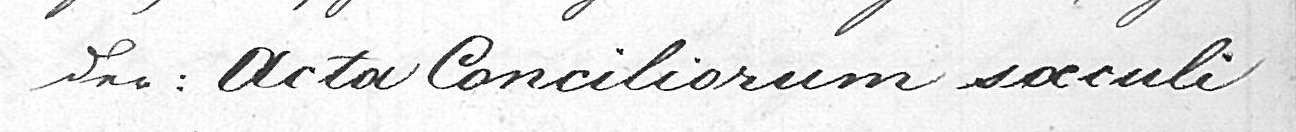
der Acta Conciliorum saeculi
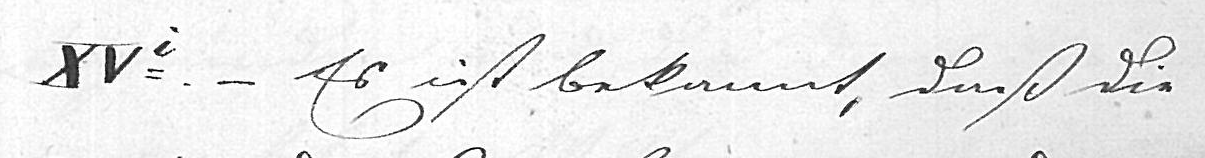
XVi. -Es ist bekannt, daß die
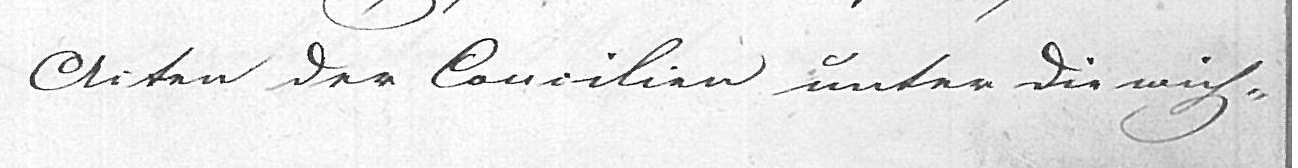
Acten der Concilien unter die wich-
